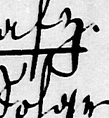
40.
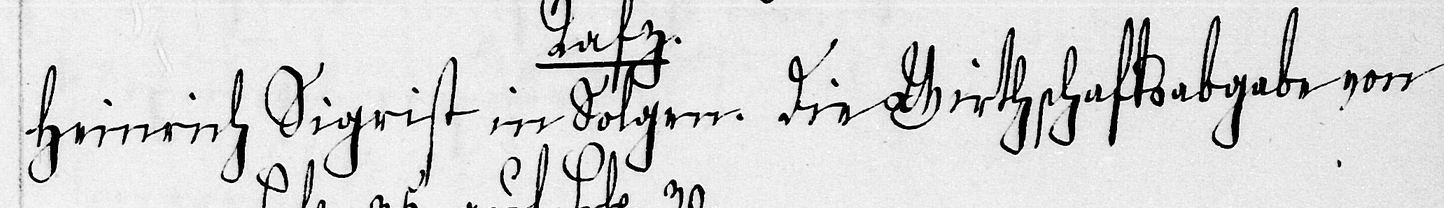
Heinrich Sigrist in Solgen. Die Wirthschaftsabgabe von
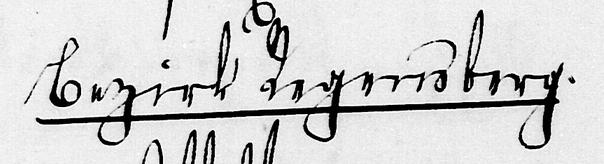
Bezirk Regensberg.
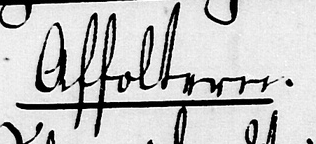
Affoltern.
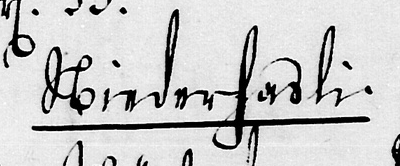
Niederhasli.
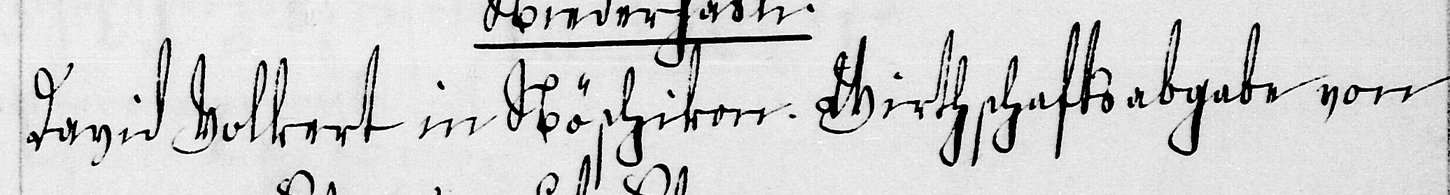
David Volkert in Nöschikon. Wirthschaftsabgabe von
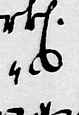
80.
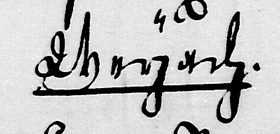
Weyach.
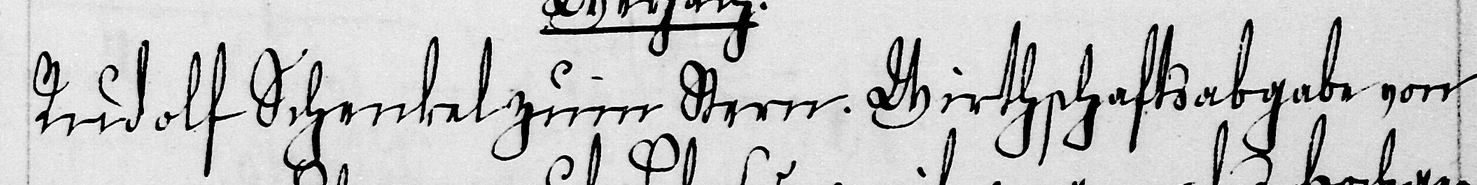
Rudolf Schenkel zum Stern. Wirthschaftsabgabe von
